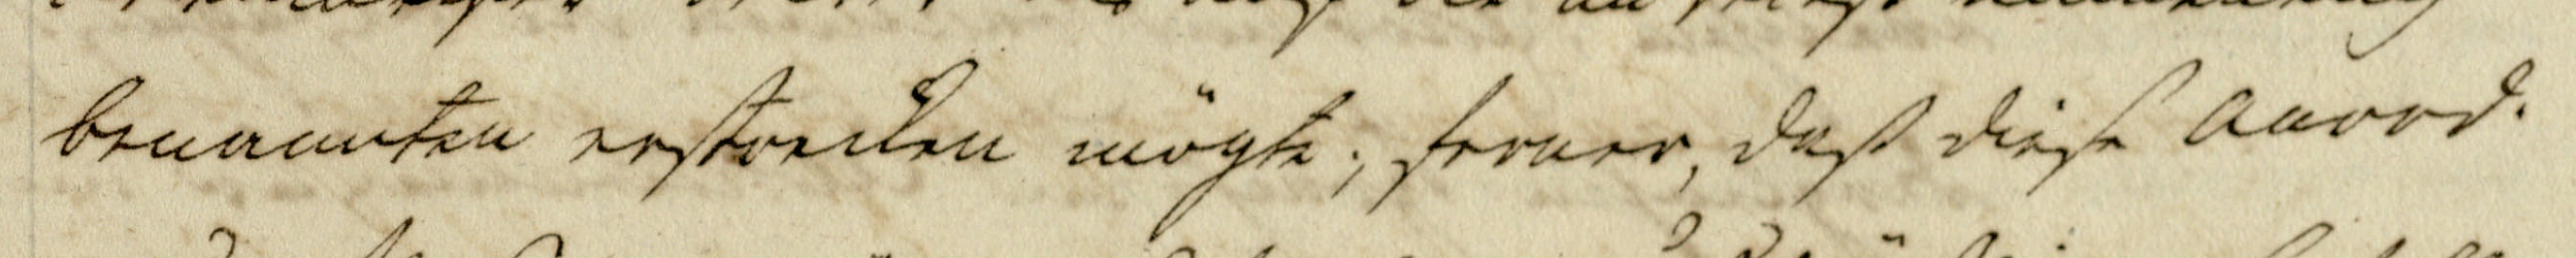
benannten erstrecken mögte; ferner, daß diese Anord¬
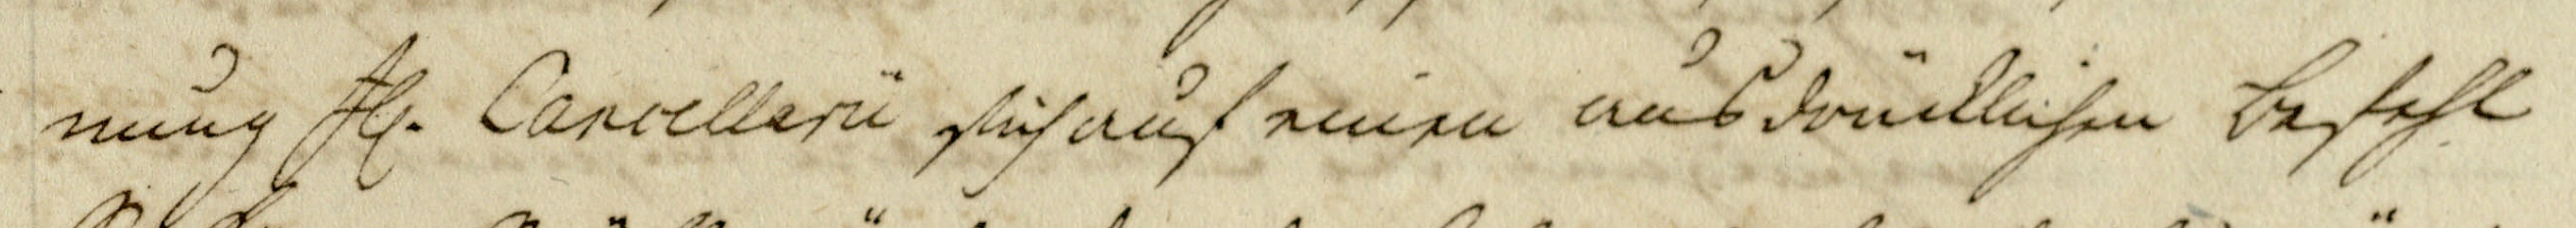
nung Ill. Cancellarii sich auf einen ausdrücklichen Befehl
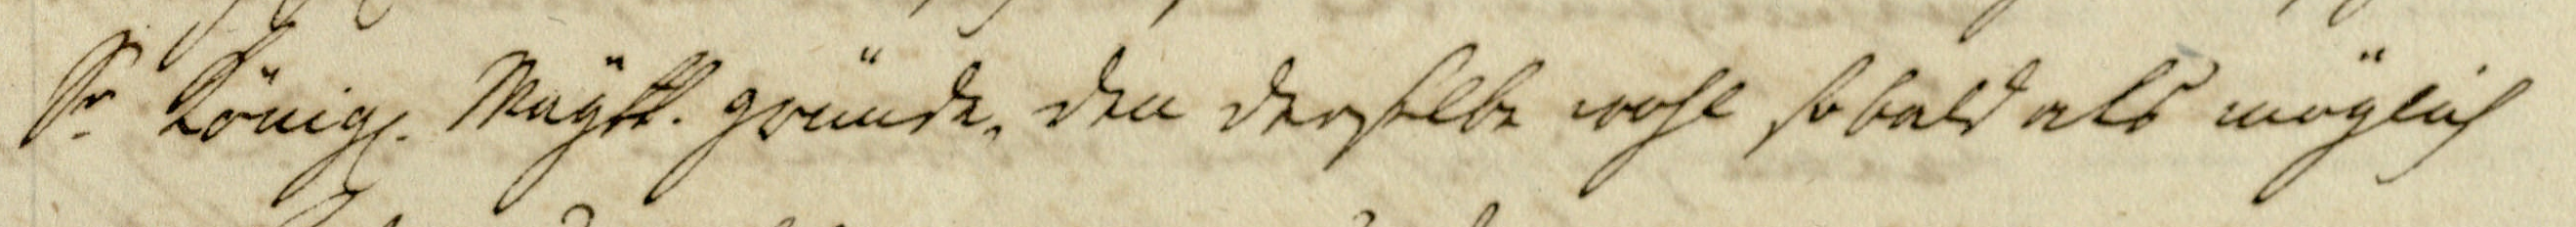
Sr Königl. Maÿtt. gründe, den derselbe wohl sobald als möglich
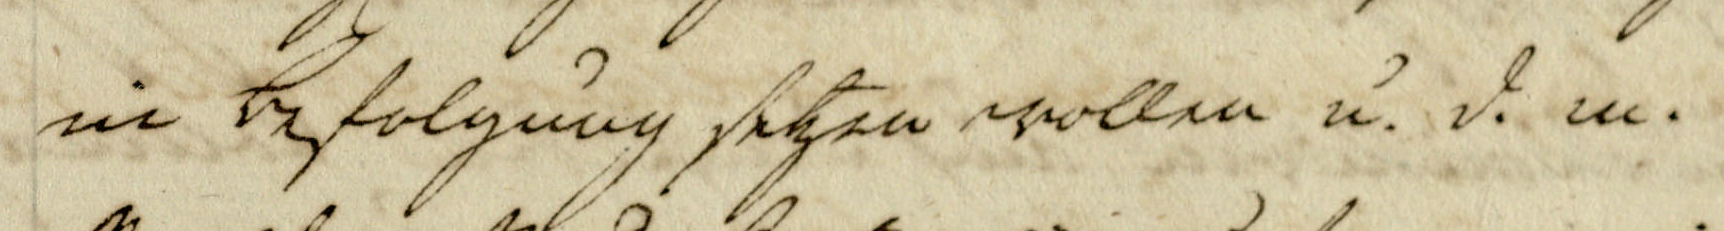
in Befolgung setzen wollen u. d. m.
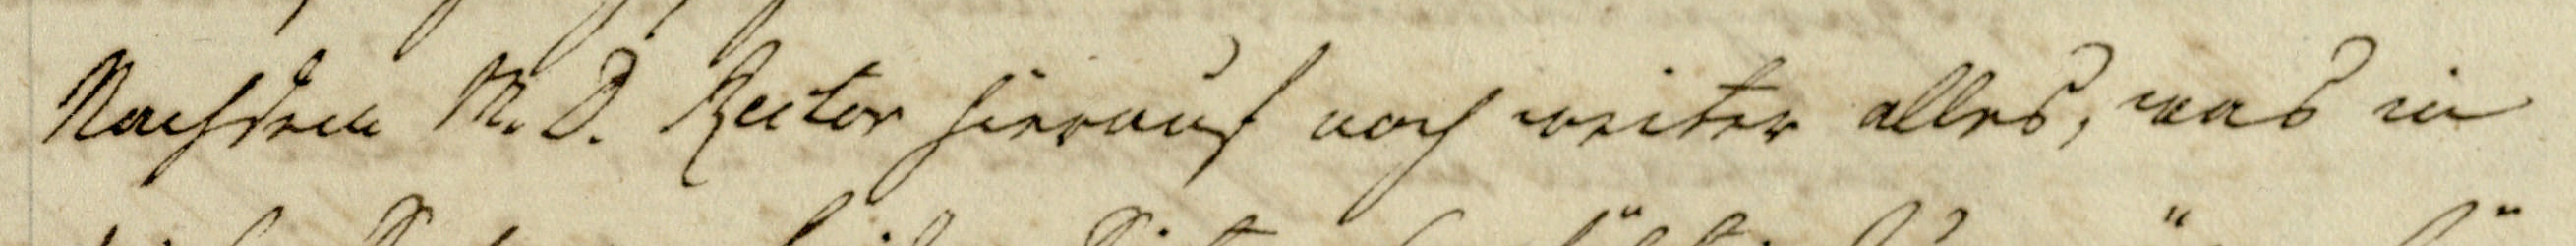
Nachdem M. D. Rector hierauf noch weiter alles, was in
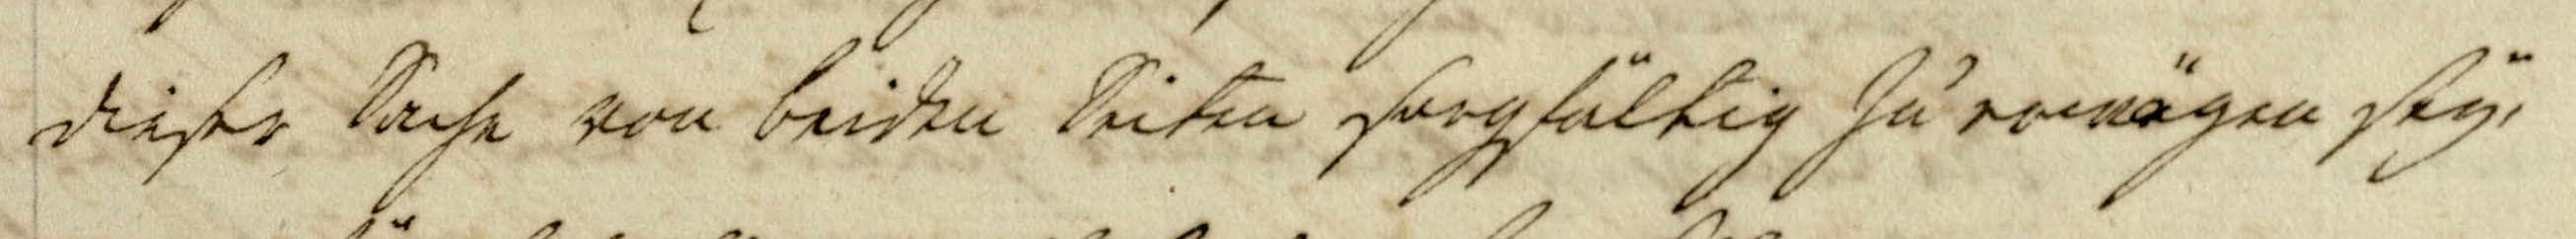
dieser Sache von beiden Seiten sorgfältig zu erwägen seÿ,
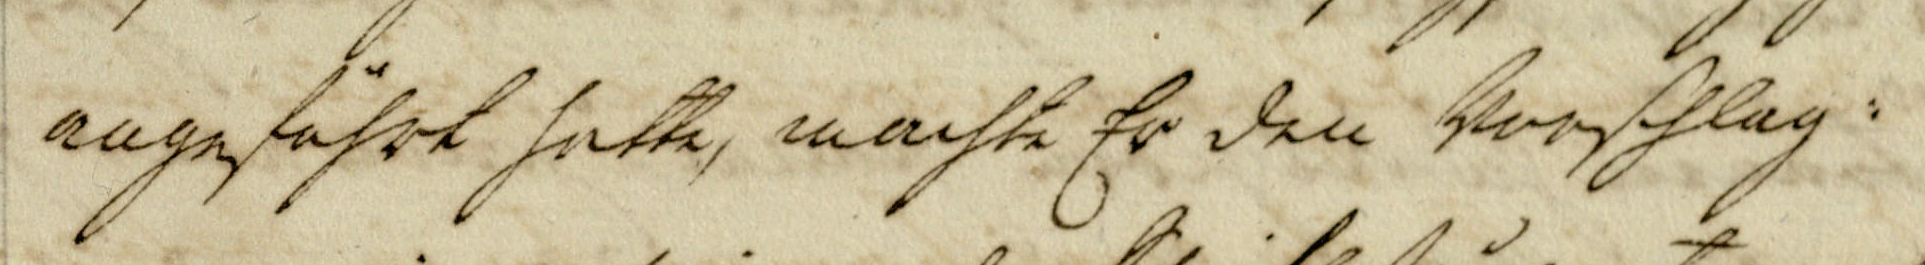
angeführt hatte, machte Er den Vorschlag:
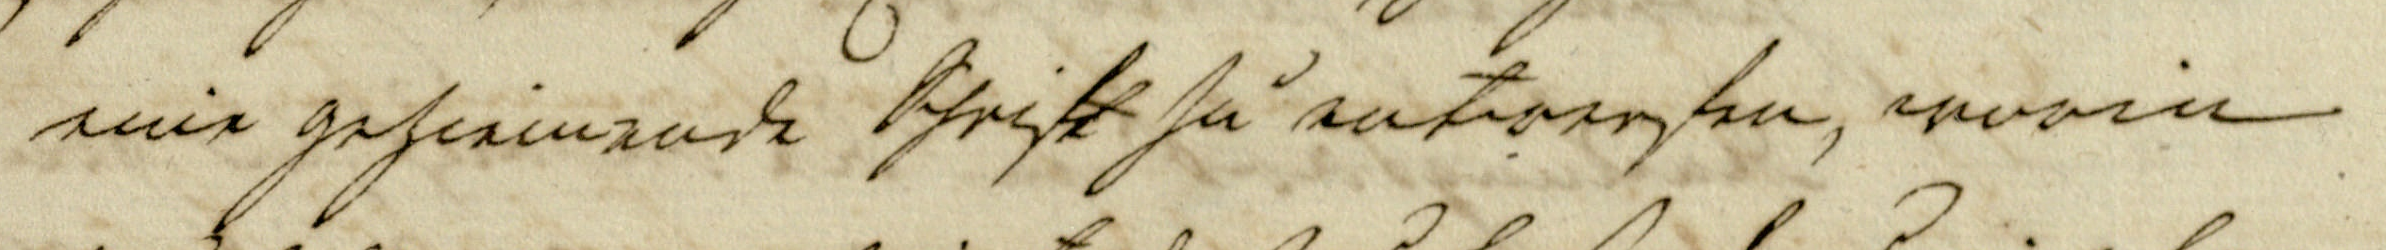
eine geziemende Schrift zu entwerfen, worin
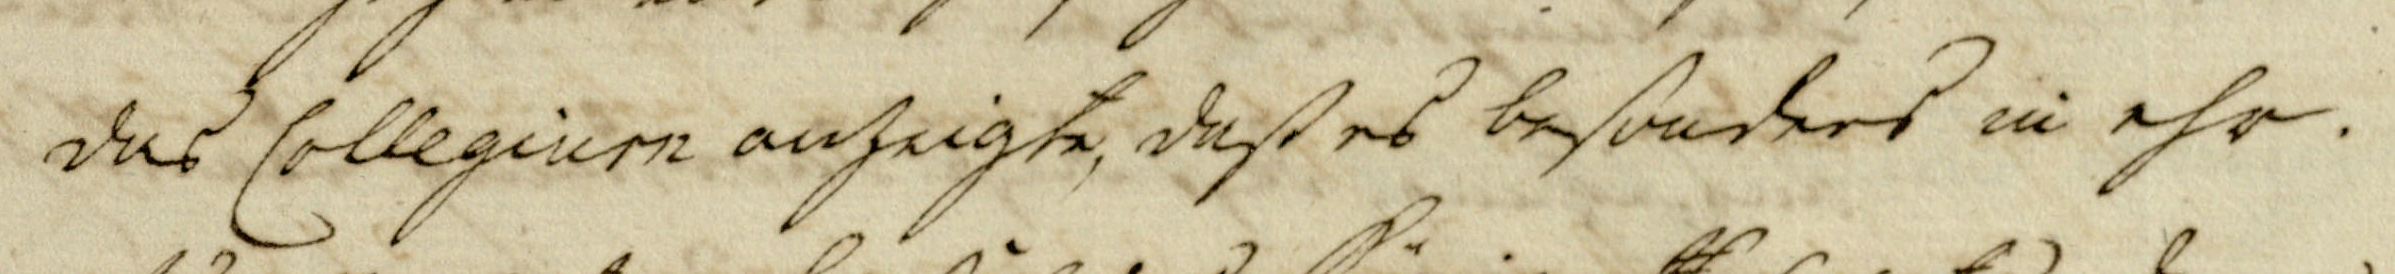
das Collegium anzeigte, daß es besonders in ehr¬
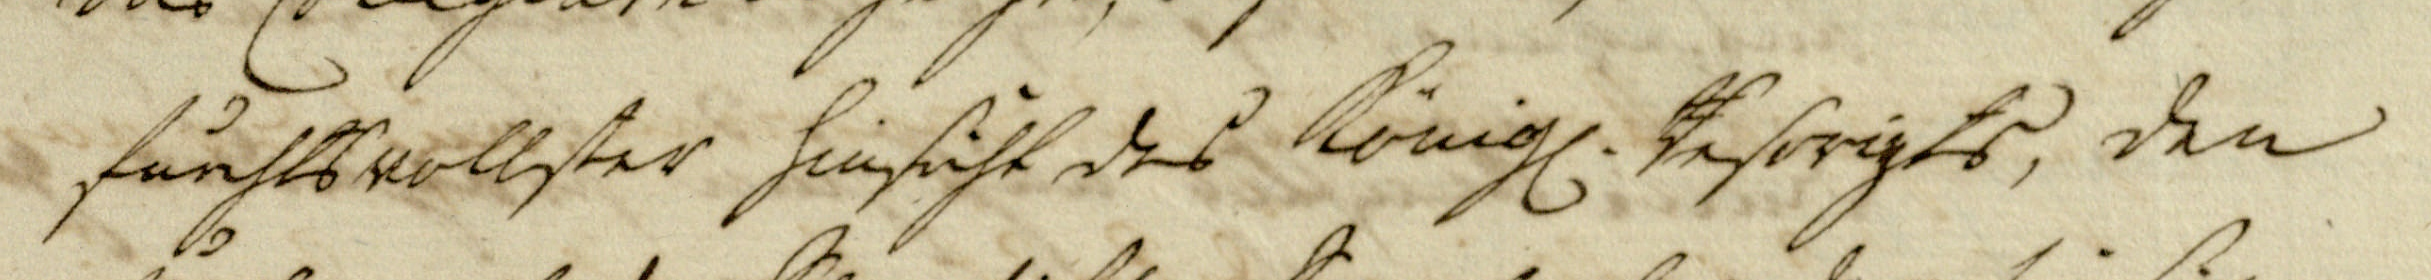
furchtsvollster Hinsicht des Königl. Rescripts, den
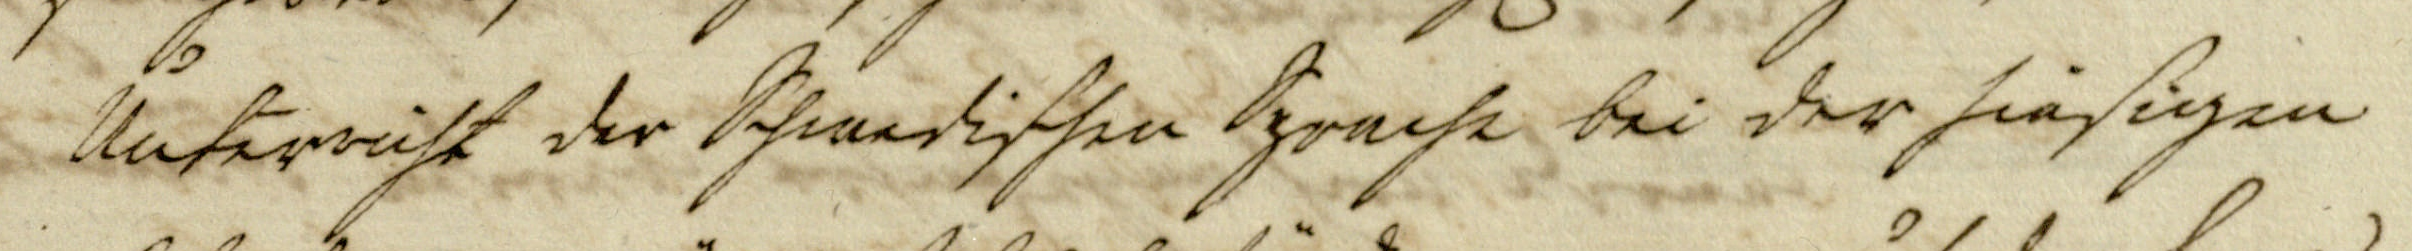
Unterricht der Schwedischen Sprache bei der hiesigen
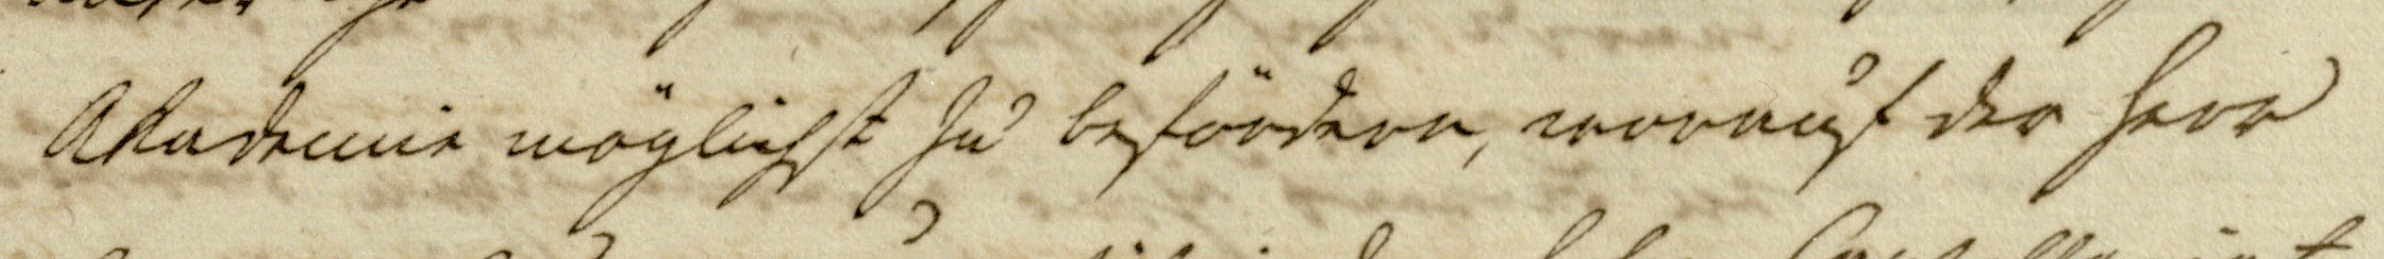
Akademie möglichst zu befördern, worauf der Herr
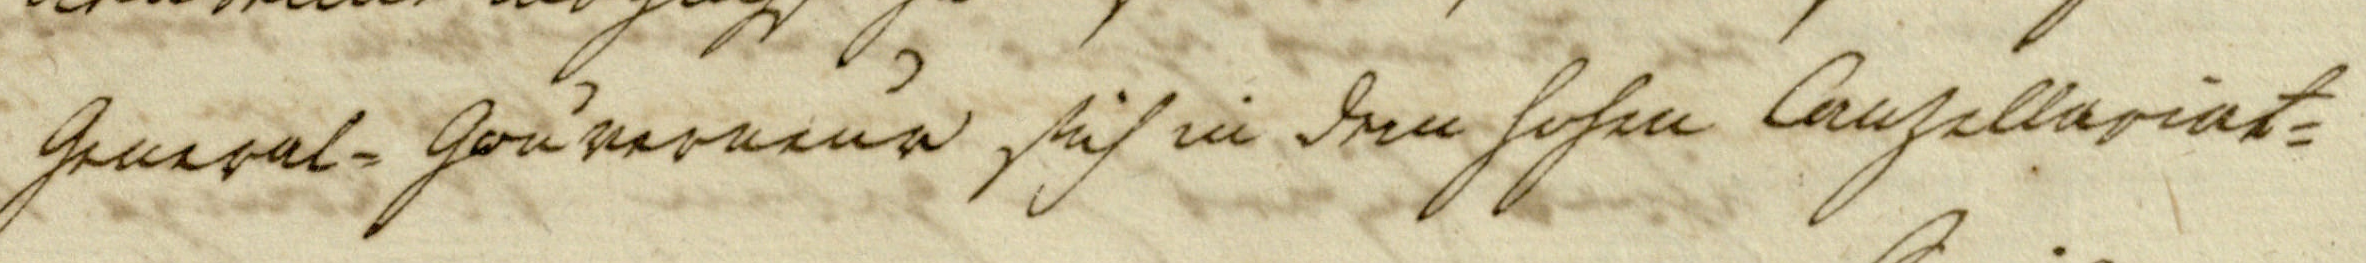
General- Gouverneur sich in dem hohen Canzellariat¬
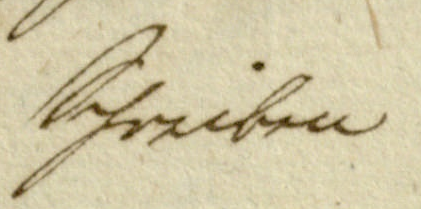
Schreiben
